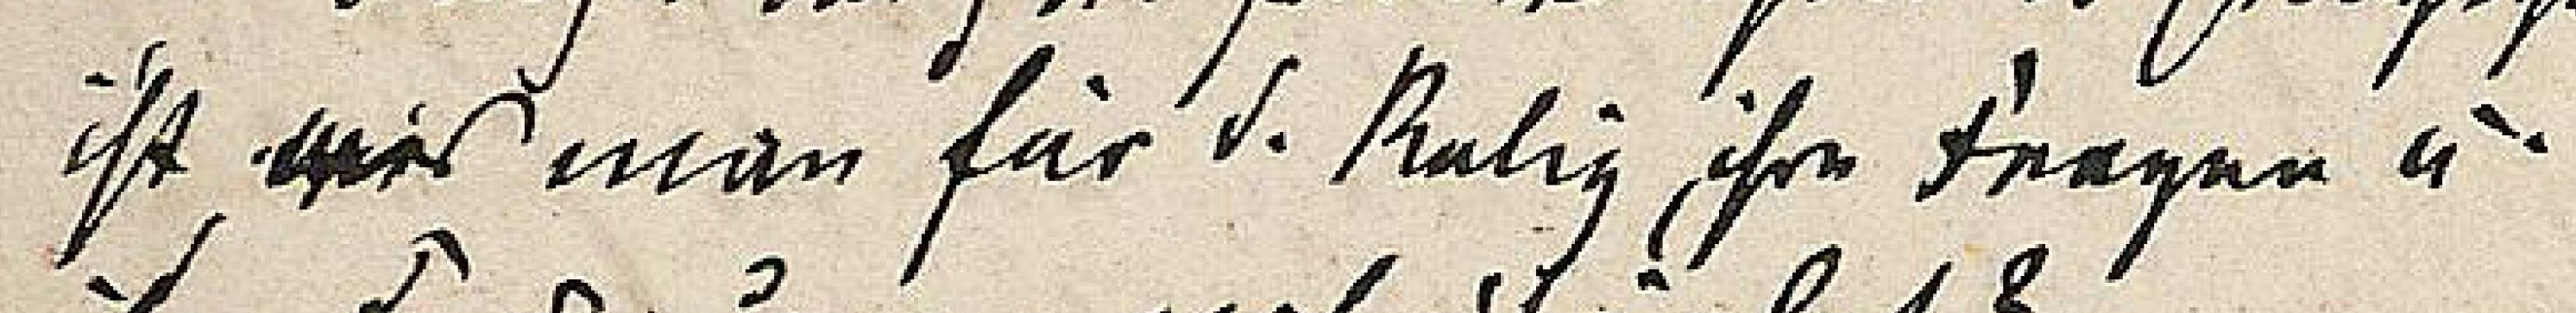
ist, was man für d. Relig, ihre Fragen u.
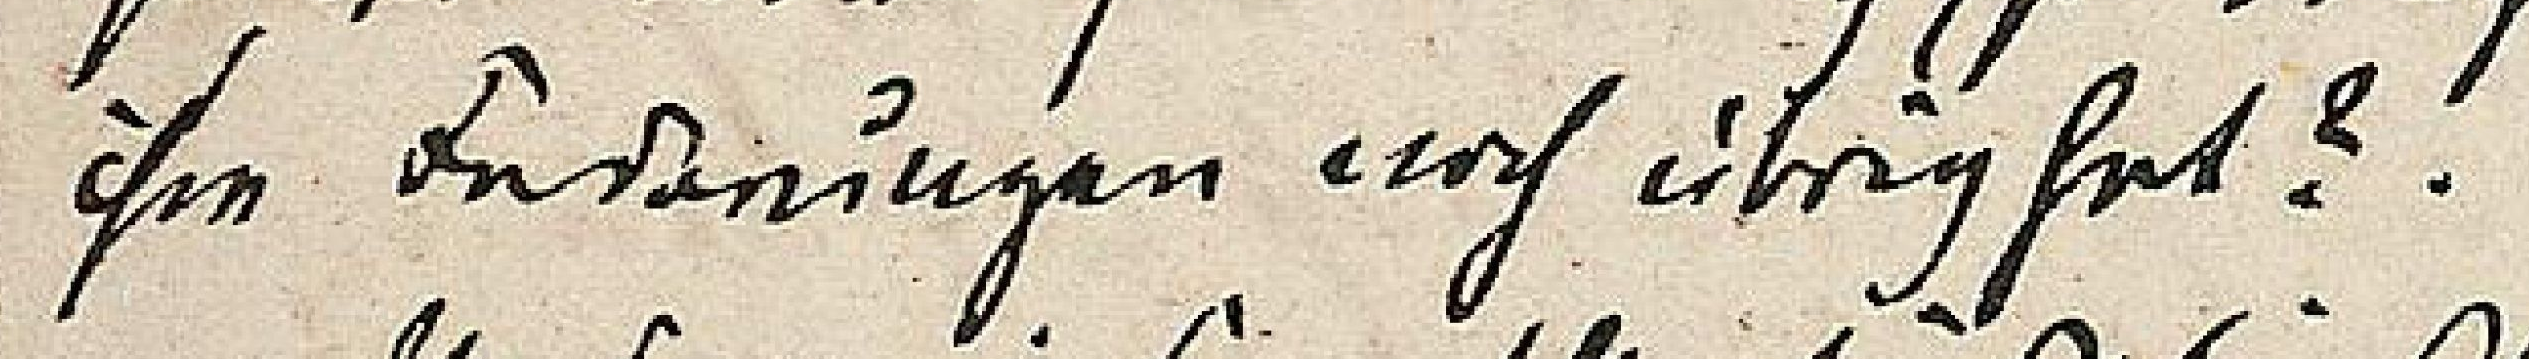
ihre Forderungen noch übrighat!"
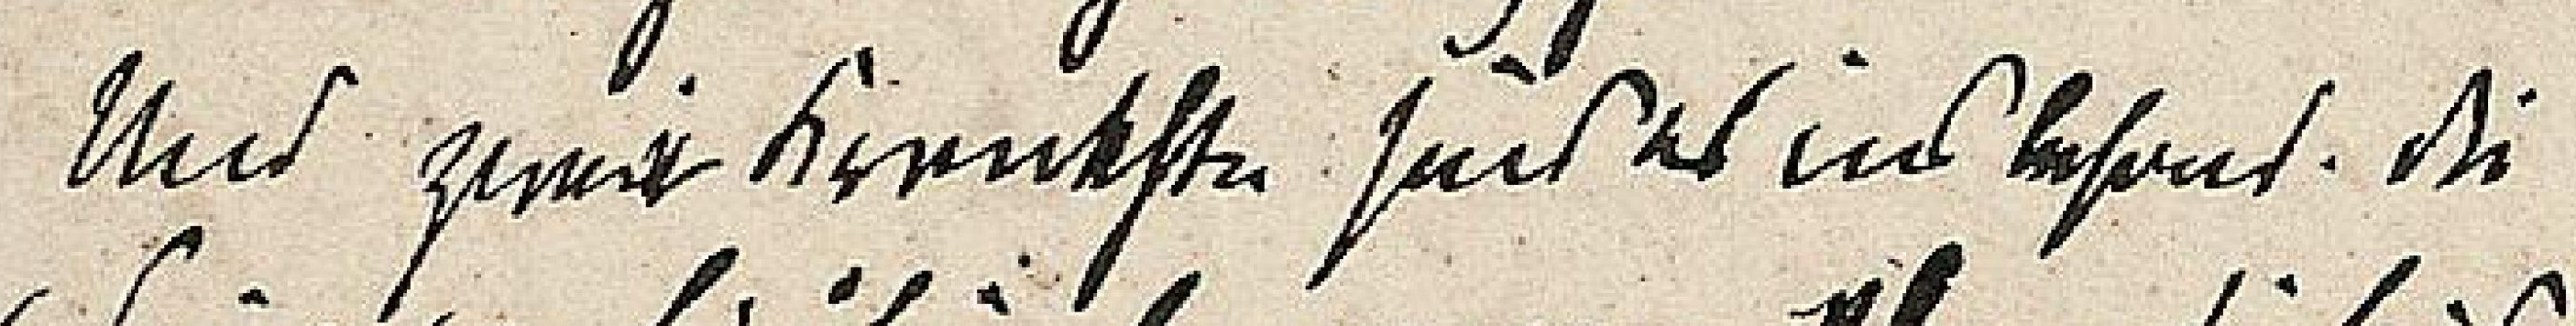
Und zwei Krankhtn sind es insbesond. die
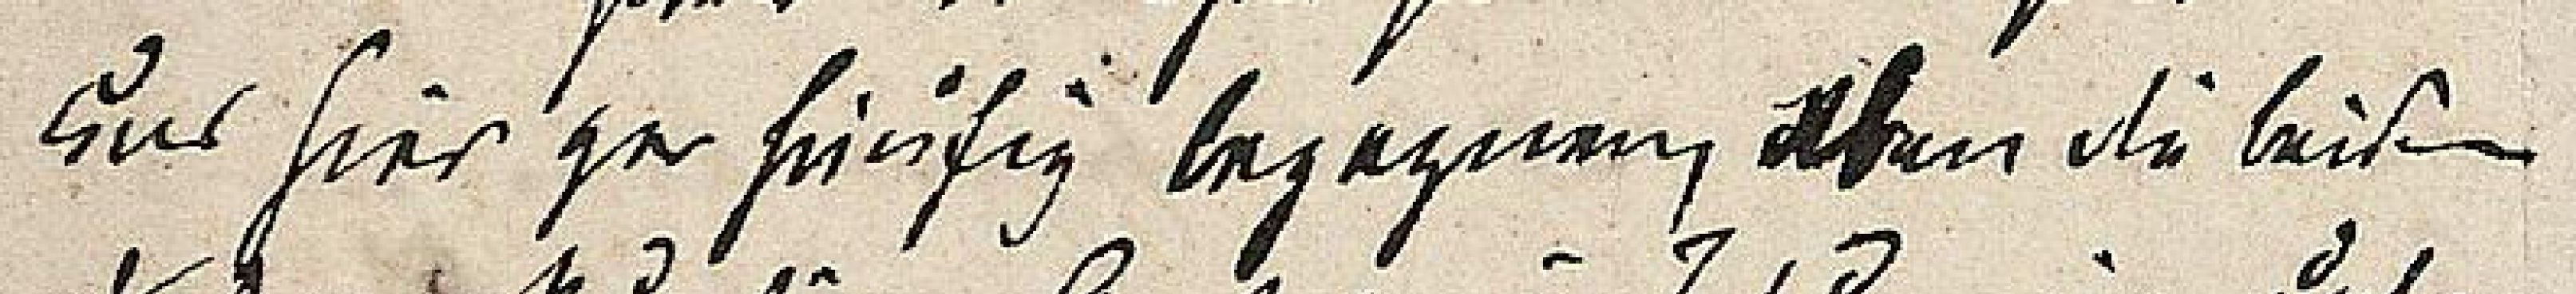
uns hier gar häufig begegnen, eben die beiden
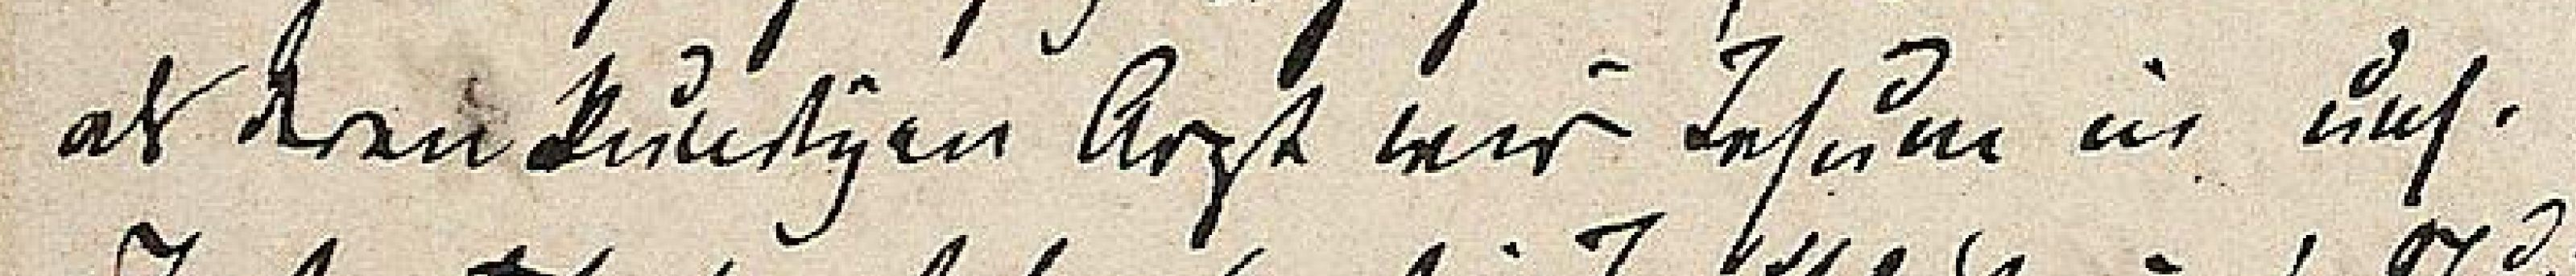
als deren kundigen Arzt wir Jesum in uns.
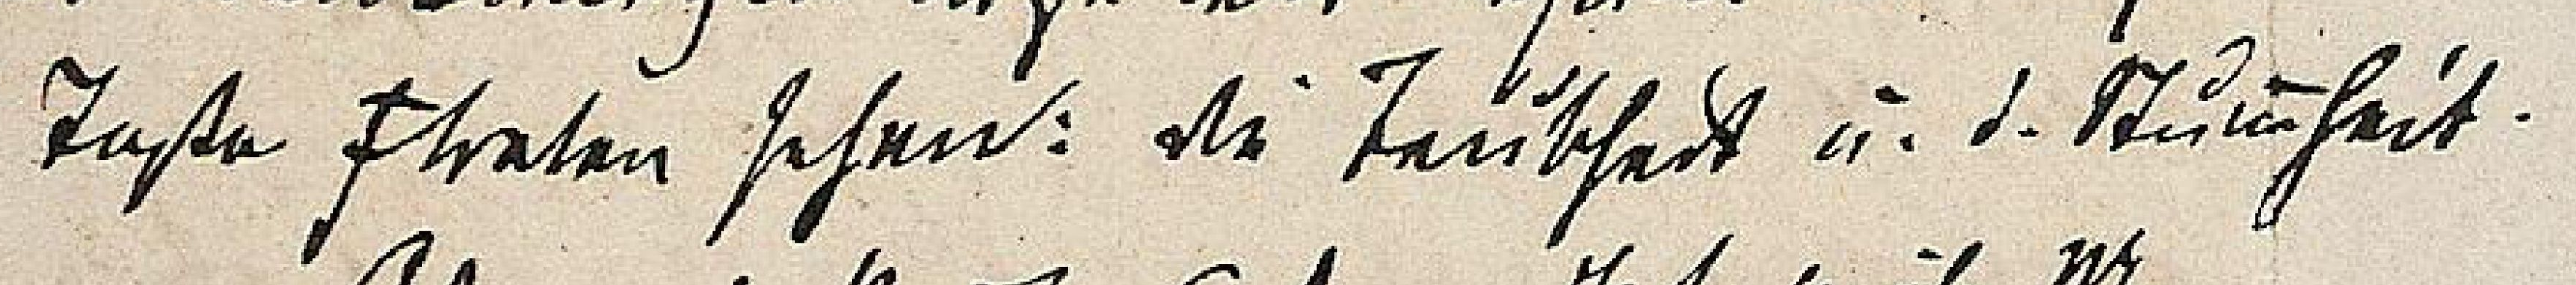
Texte ftreten sehen: die Taubheit u. d. Stumheit.
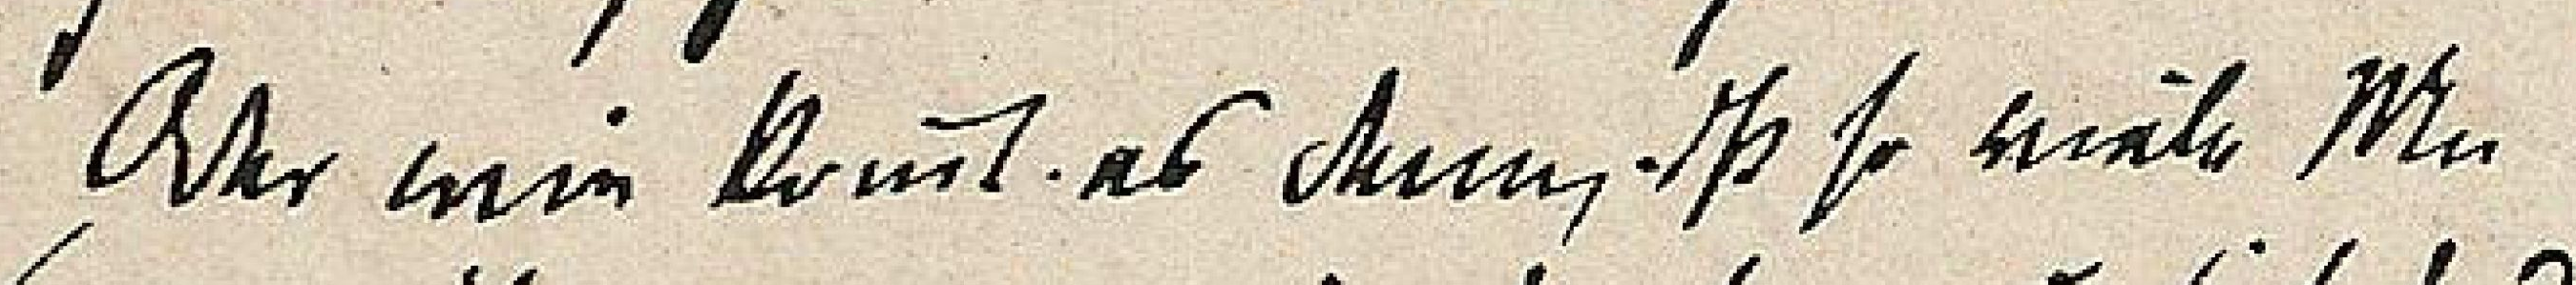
Oder wie kommt es denn, daß so viele Mn
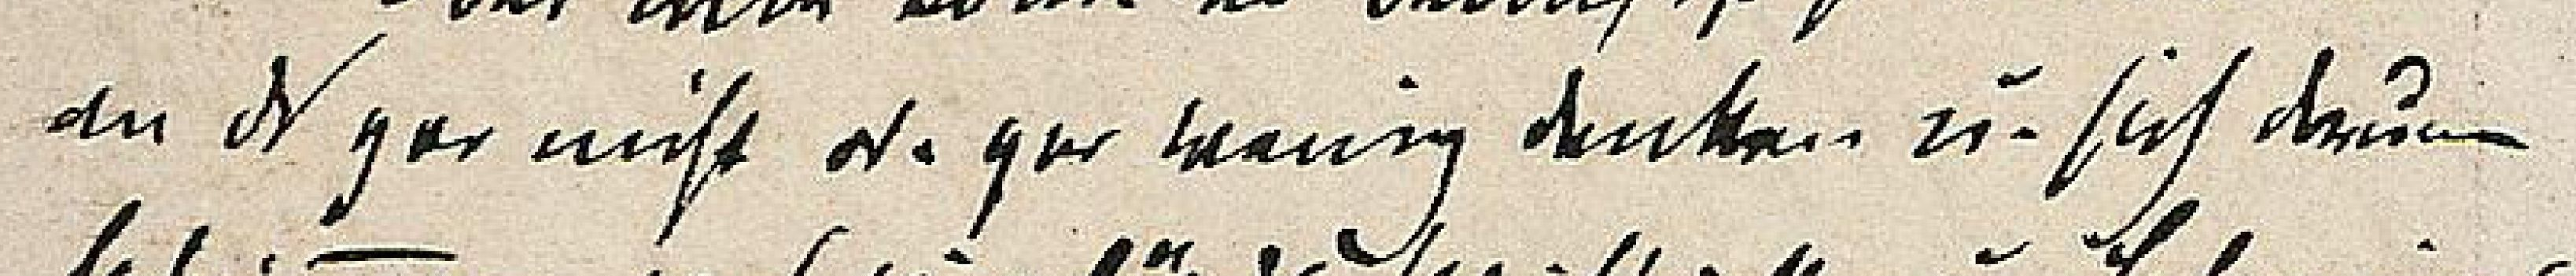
an das gar nicht od. gar wenig denken u. sich darum
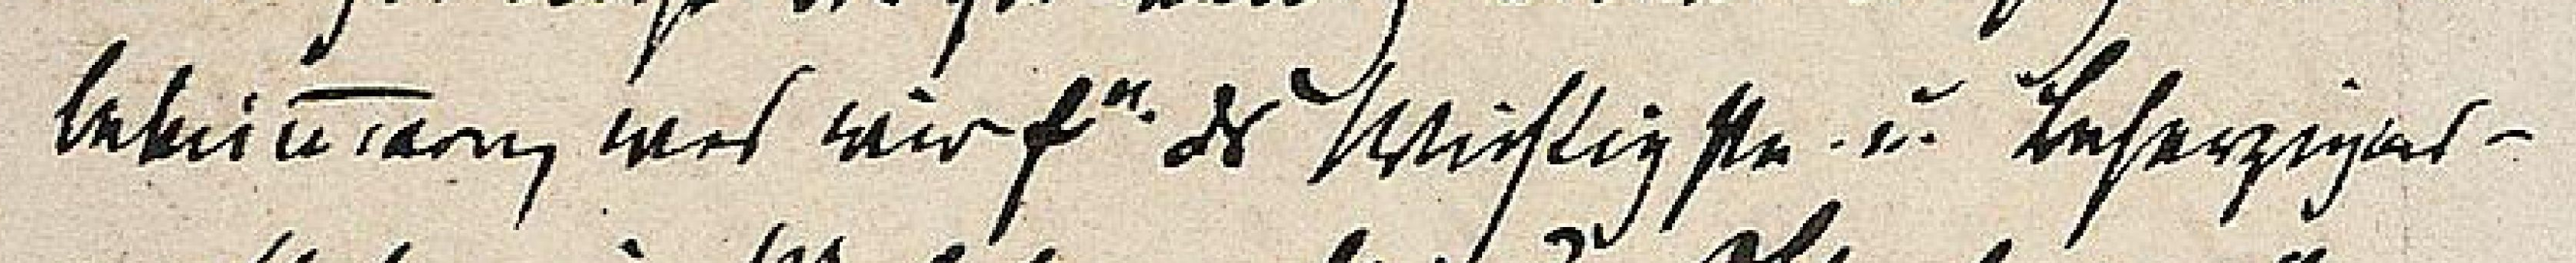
bekümern, was wir fü ds Wichtigste u. Beherzigens¬
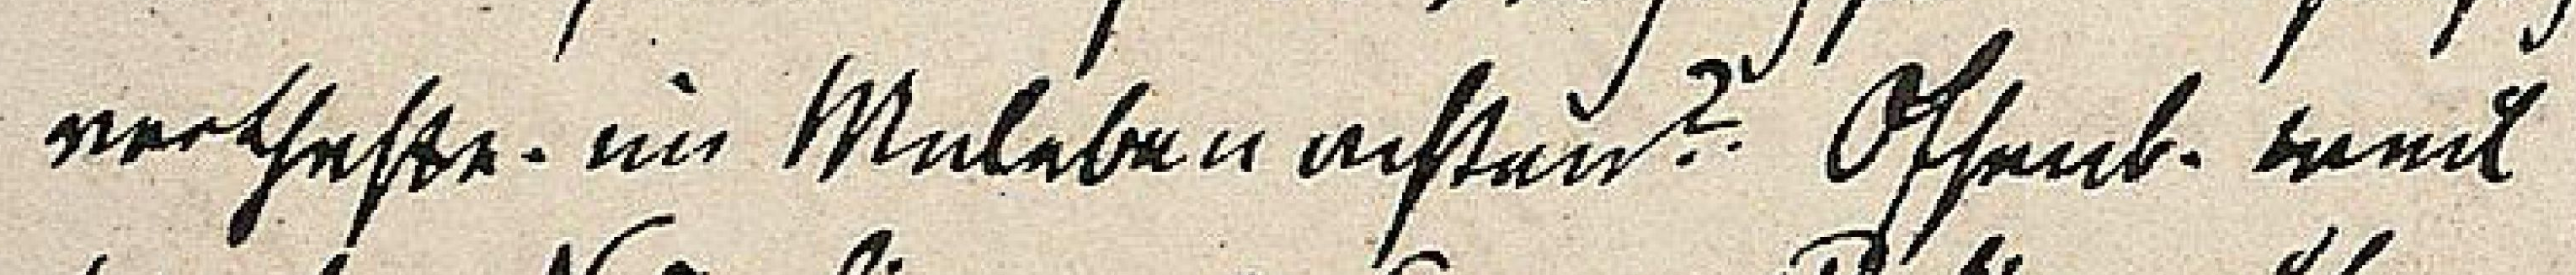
wertheste im Mnleben achten? Offenb. weil
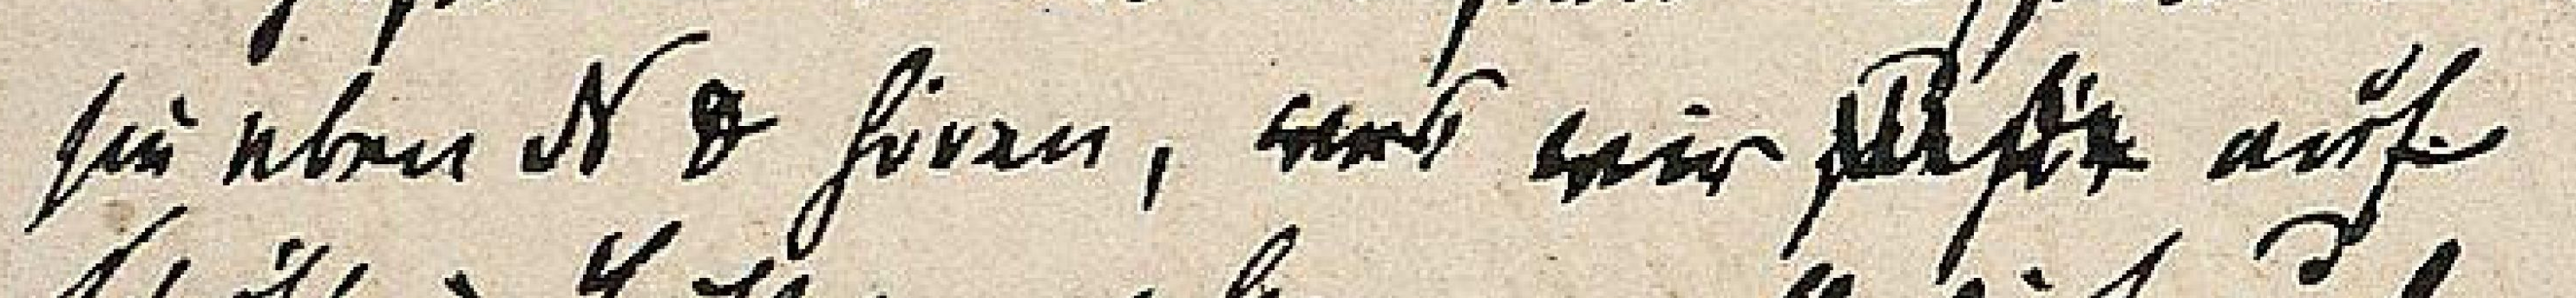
sie eben ds o hören, was wir zu hö auf
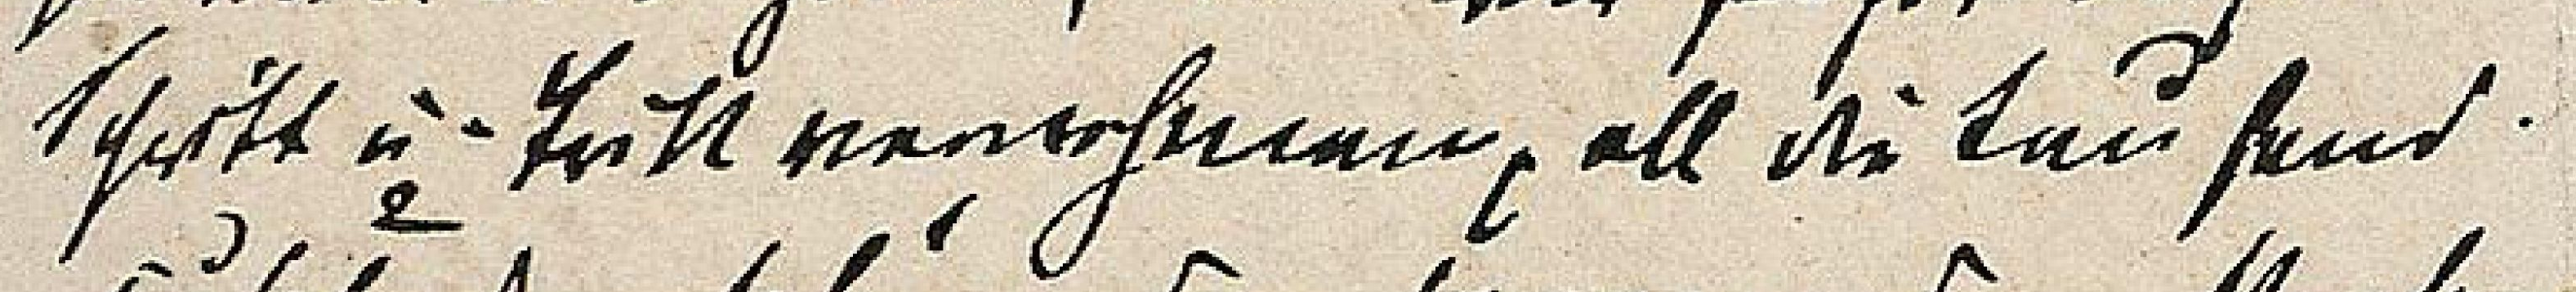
Schrift u. Tritt vernhmen, all die tausend
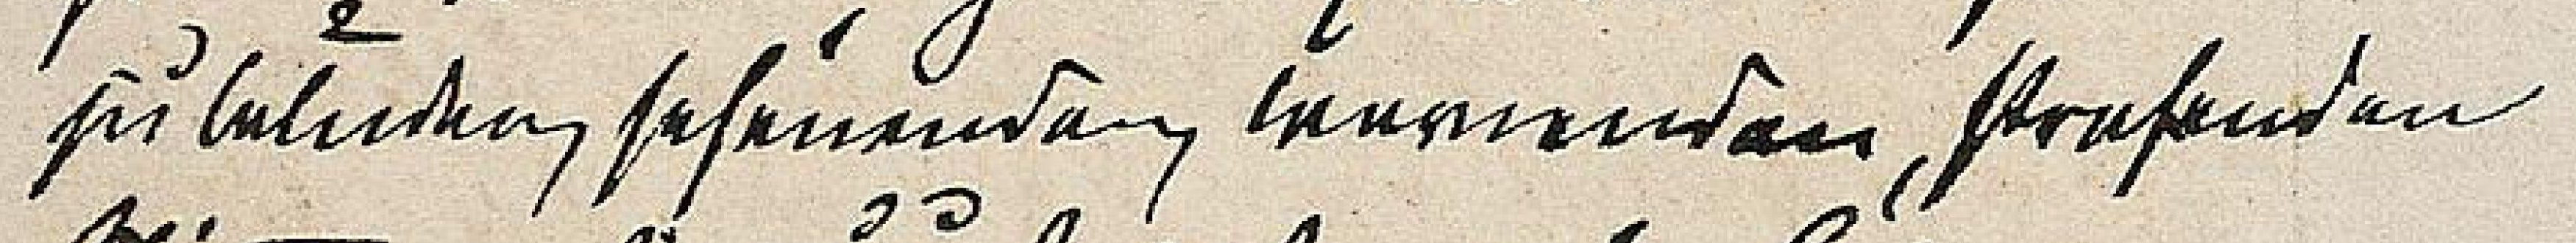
jubelnden, sehenden, warnenden, strafenden
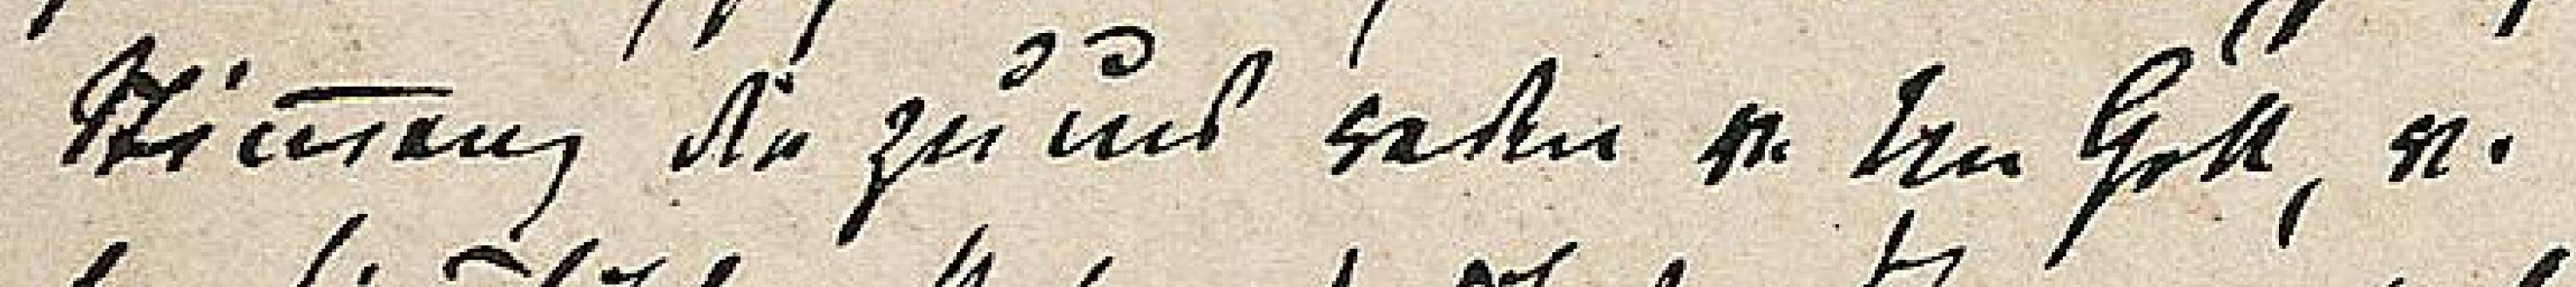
Stimen, die zu uns reden v. 1m Gott, v.
